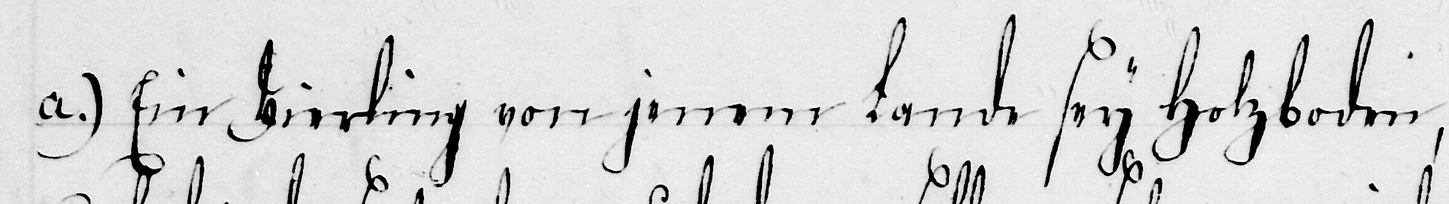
a.) Ein Vierling von jenem Lande sey Holzboden,
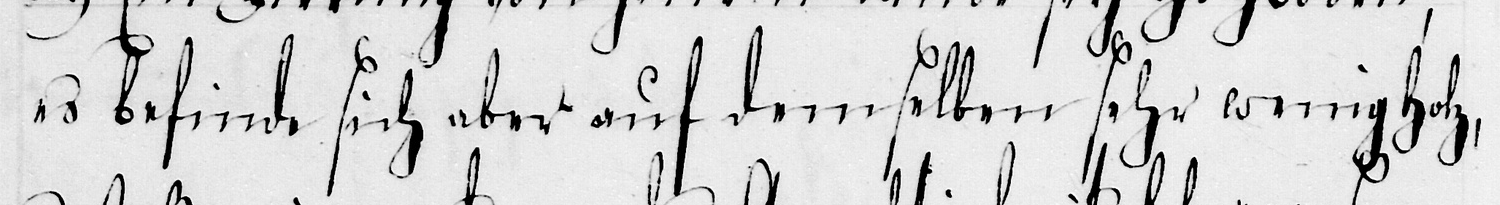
es befinde sich aber auf demselben sehr wenig Hol¬
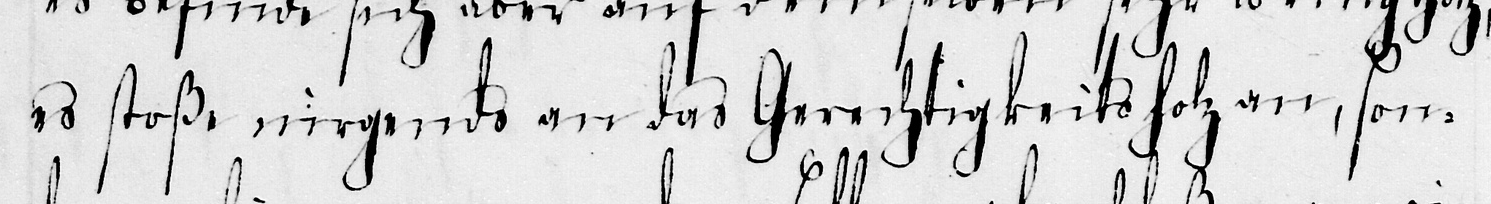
es stoße nirgends an das Gerechtigkeitsholz an, son¬
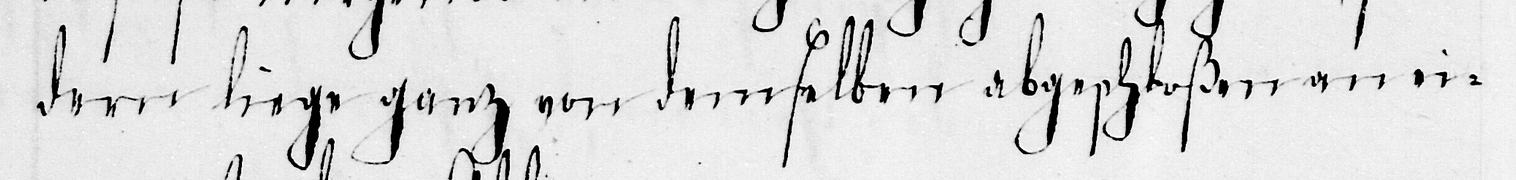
dern liege ganz von demselben abgeschloßen an ei¬
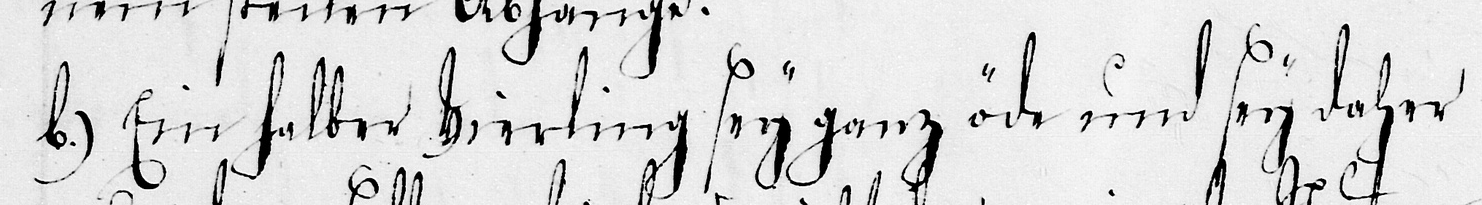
b.) Ein halber Vierling sey ganz öde und sey daher
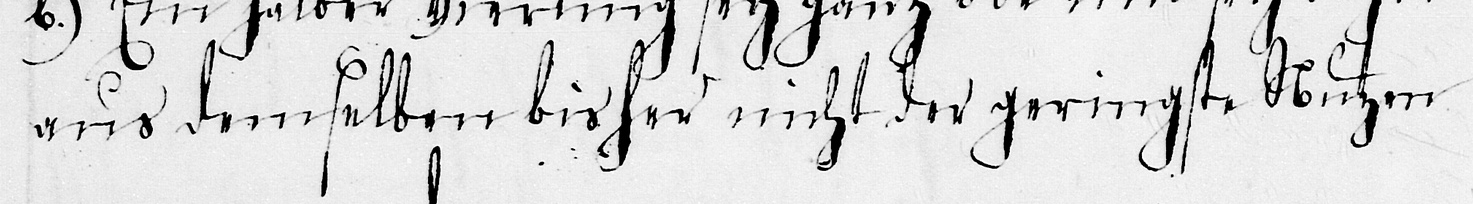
aus demselben bisher nicht der geringste Nutzen
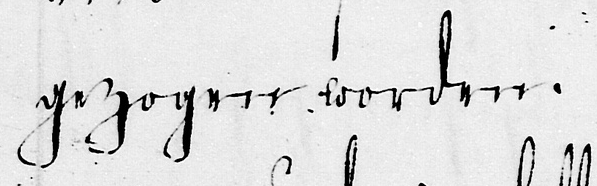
gezogen worden.
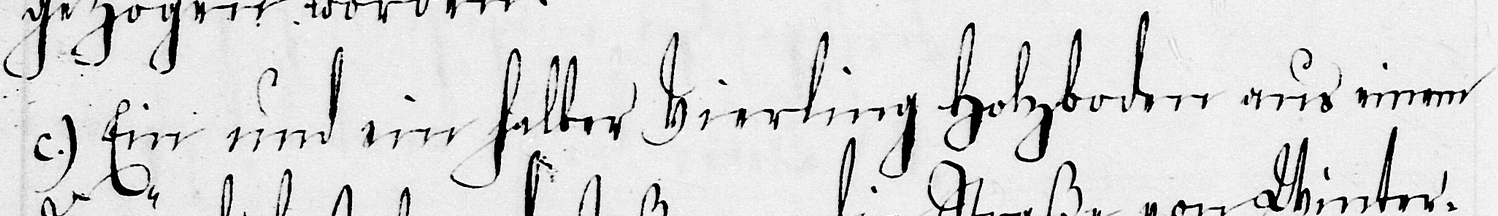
c.) Ein und ein halber Vierling Holzboden aus einem
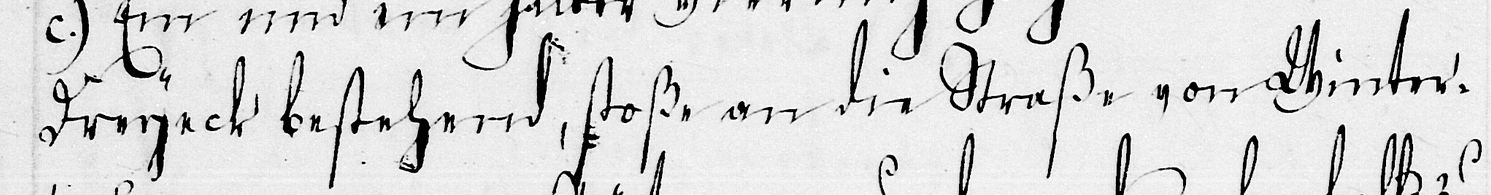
Dreyeck bestehend, stoße an die Straße von Winter¬
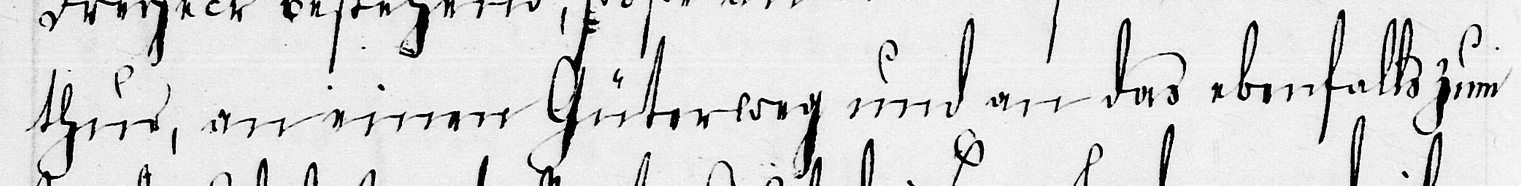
thur, an einen Güterweg und an das ebenfalls zum
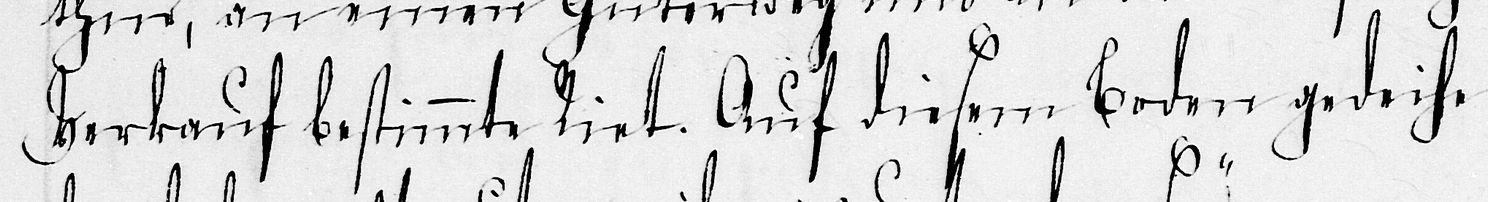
Verkauf bestimmte Riet. Auf diesem Boden gedeihe
